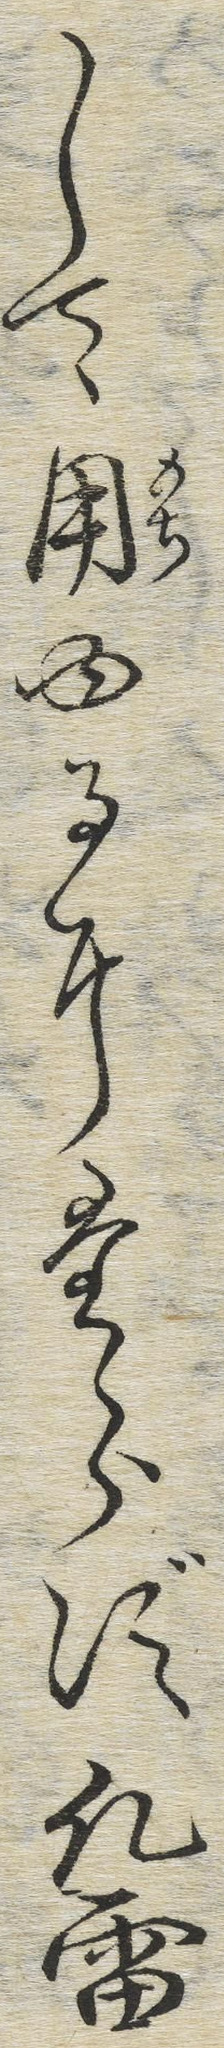して用ゆるにたらず凡雷
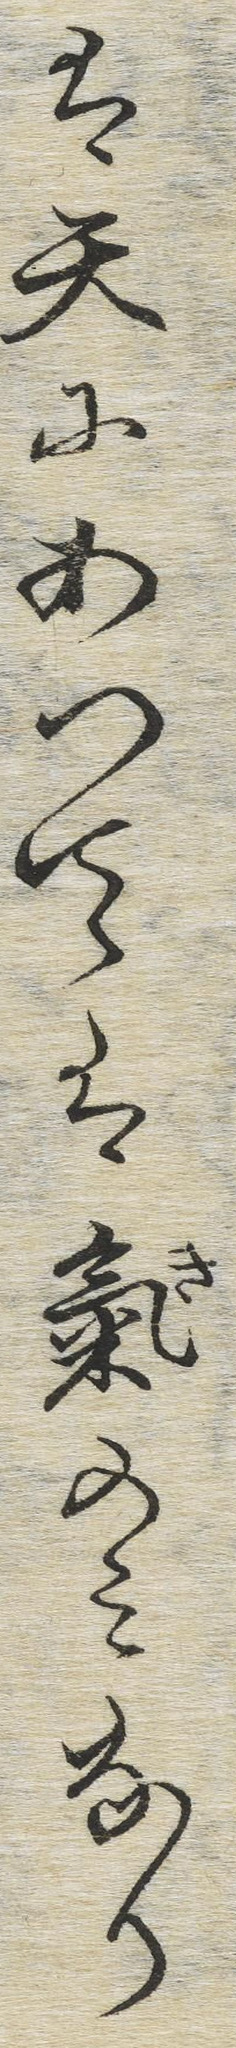は天にあつては気のみなり
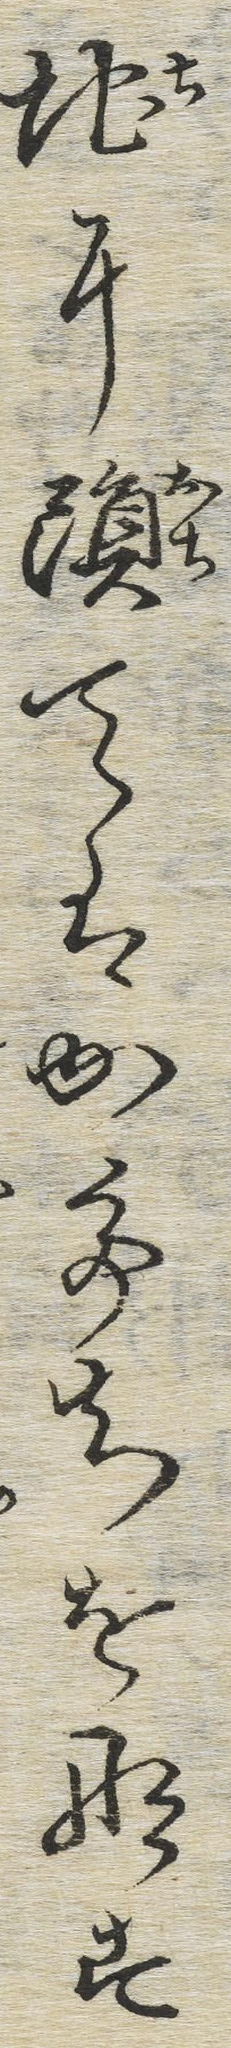地に隕てはかたちをなす
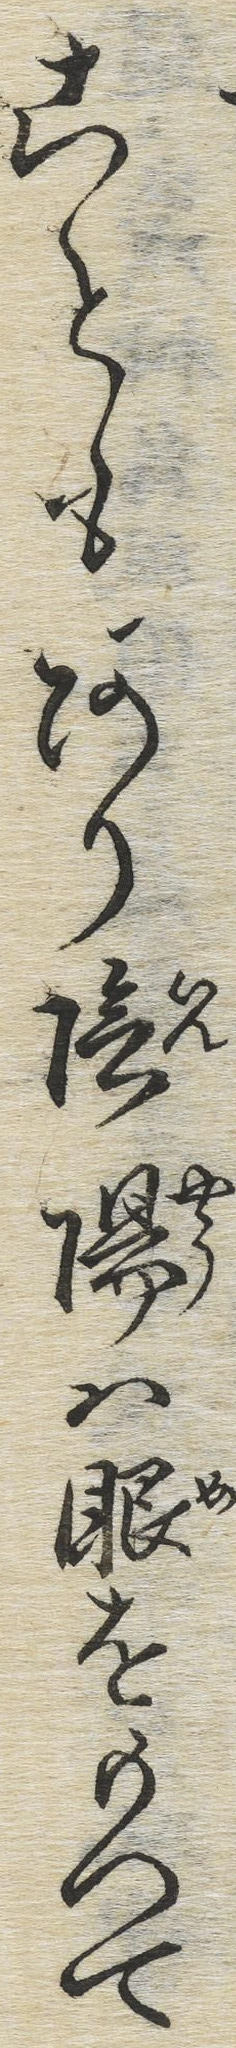こともあり陰陽は眼をもつて
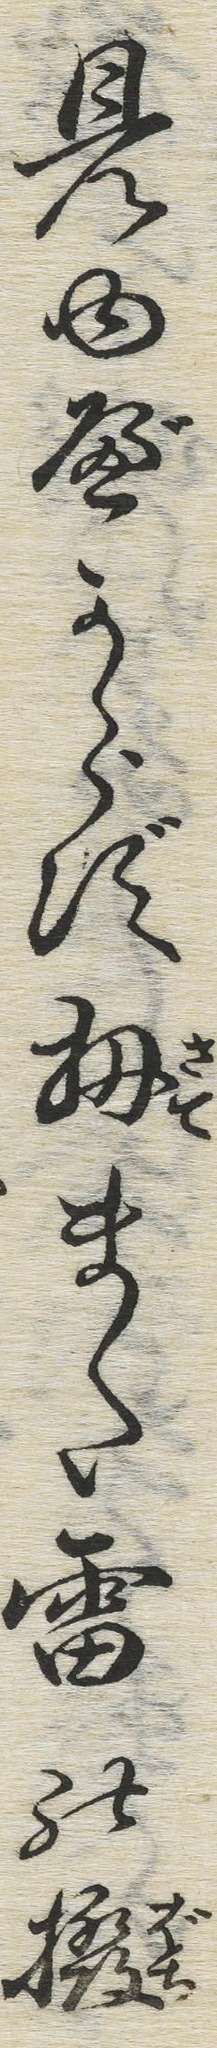見ゆべからず扨また雷の撥
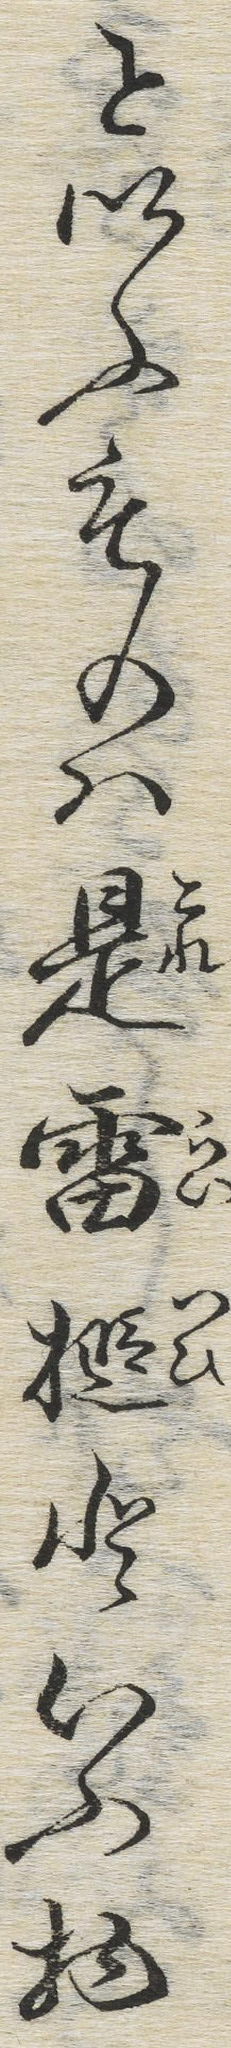というものは是雷槌といふ物
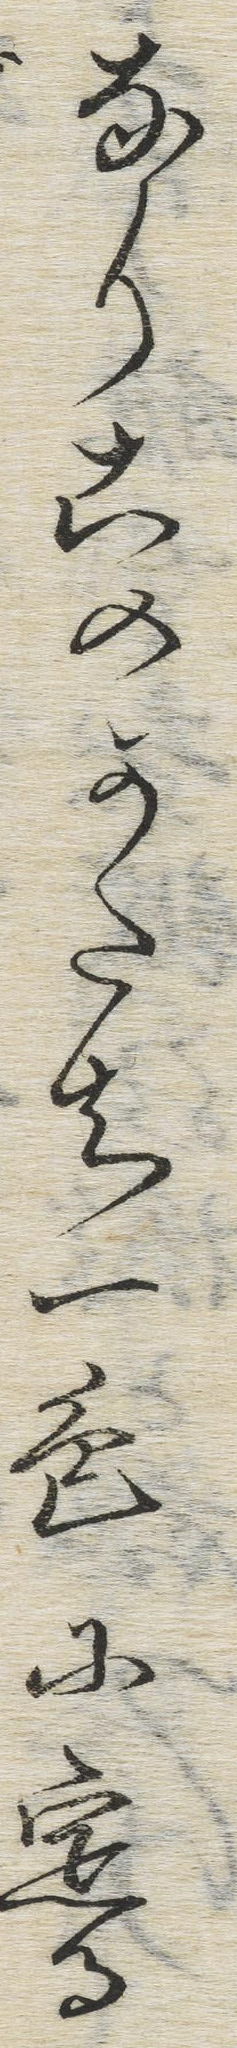なりこのかたち一色に定る
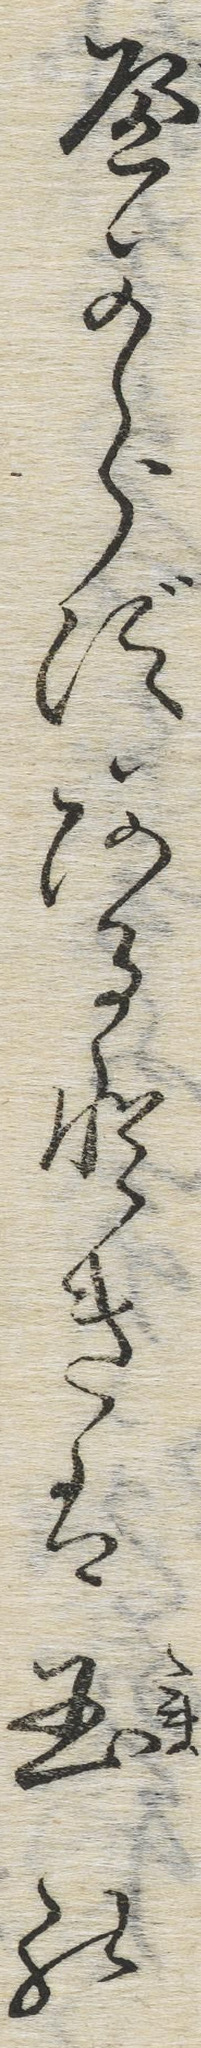べからずあるときは玉の
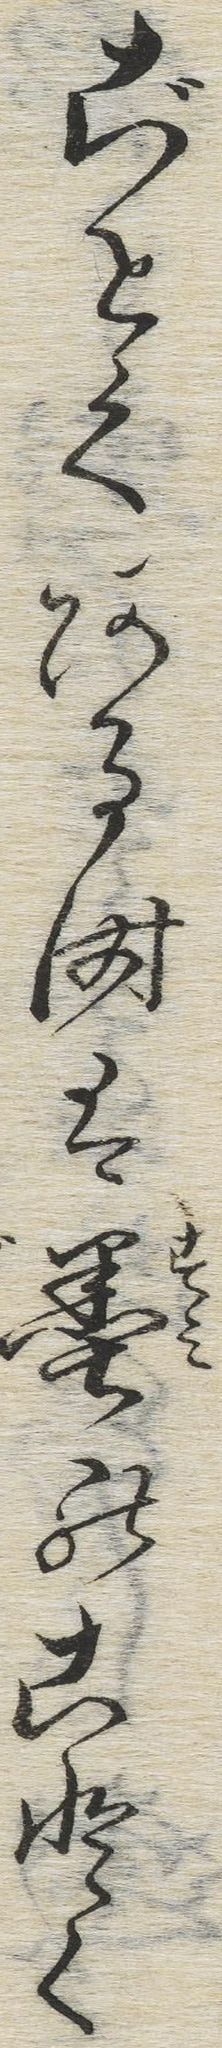ごとくある時は墨のことく
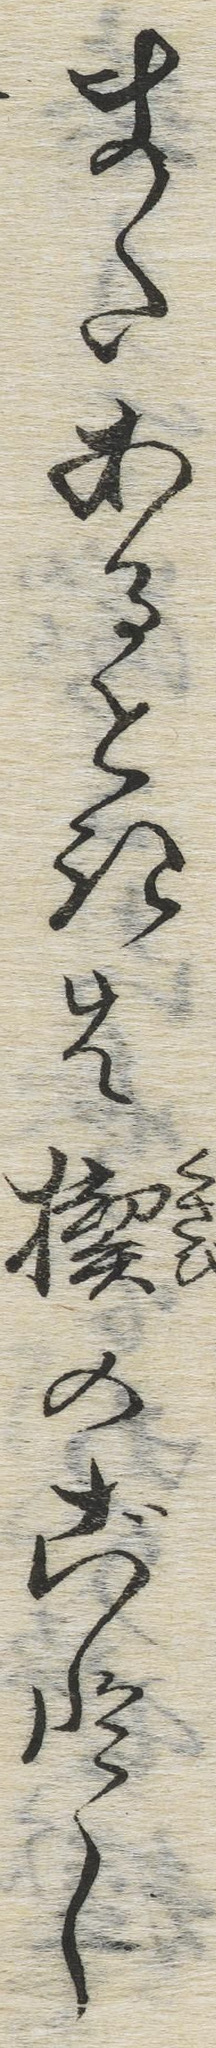またあるときは楔のごとし
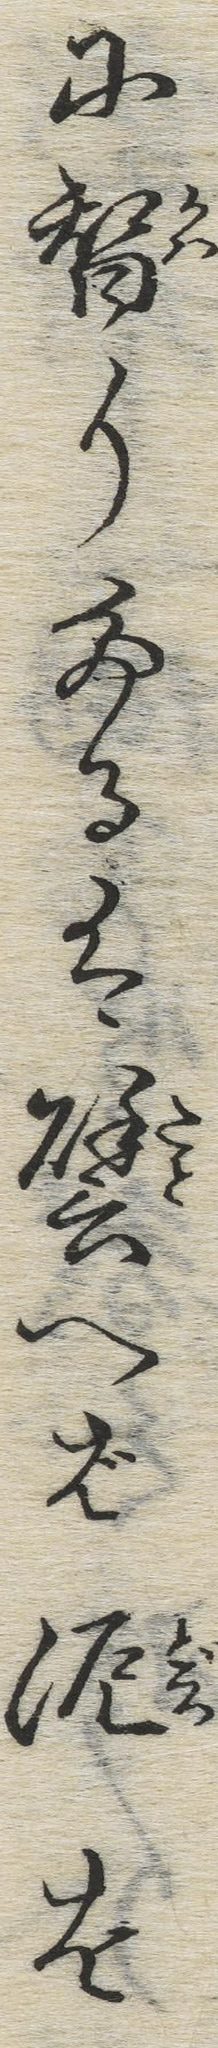に替りたるは譬へば泥は

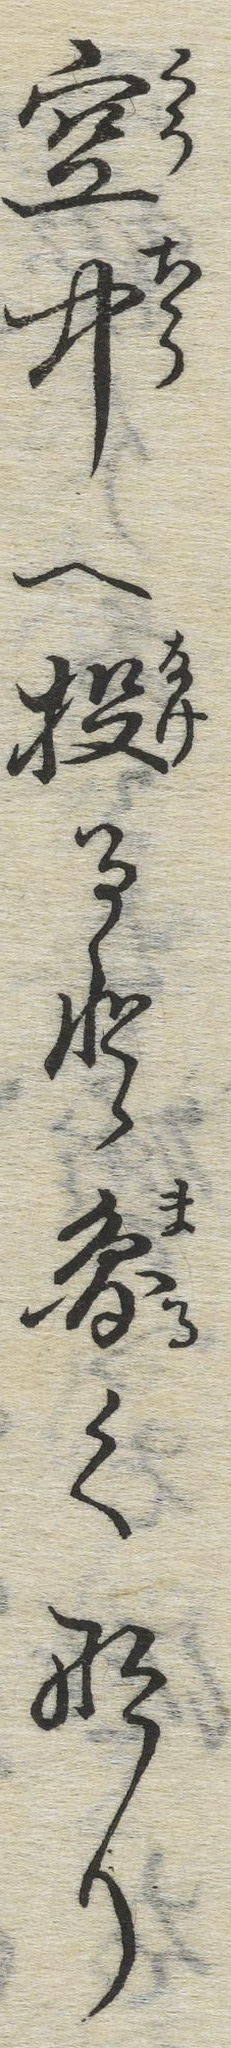空中へ投ると圓くなり
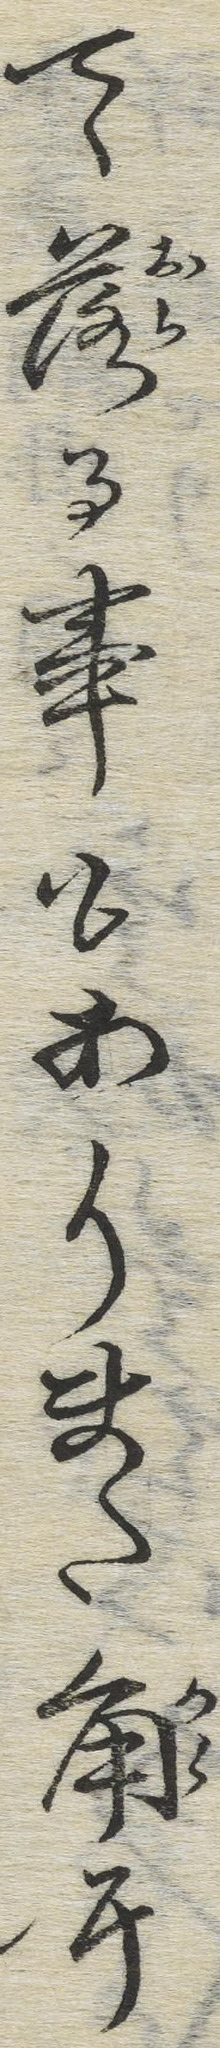て落る事もありまた角に
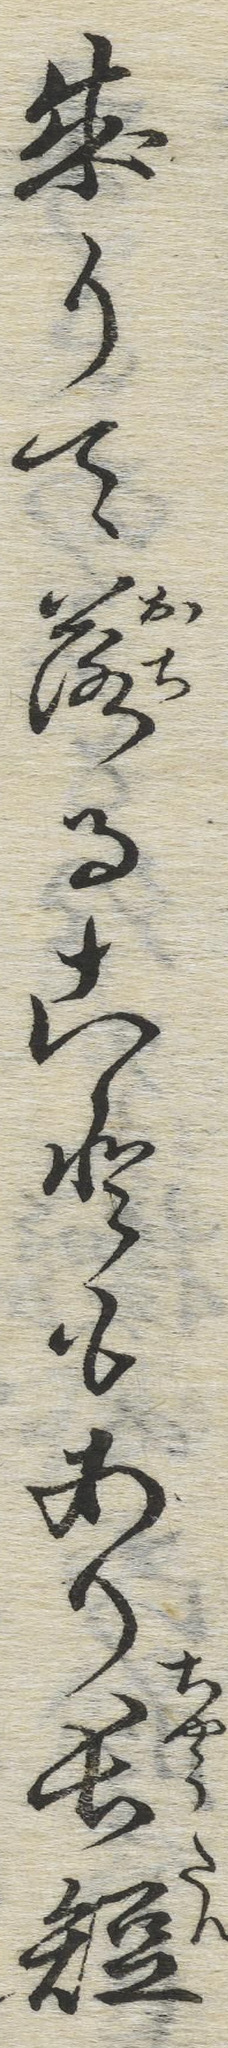成りて落ることもあり長短
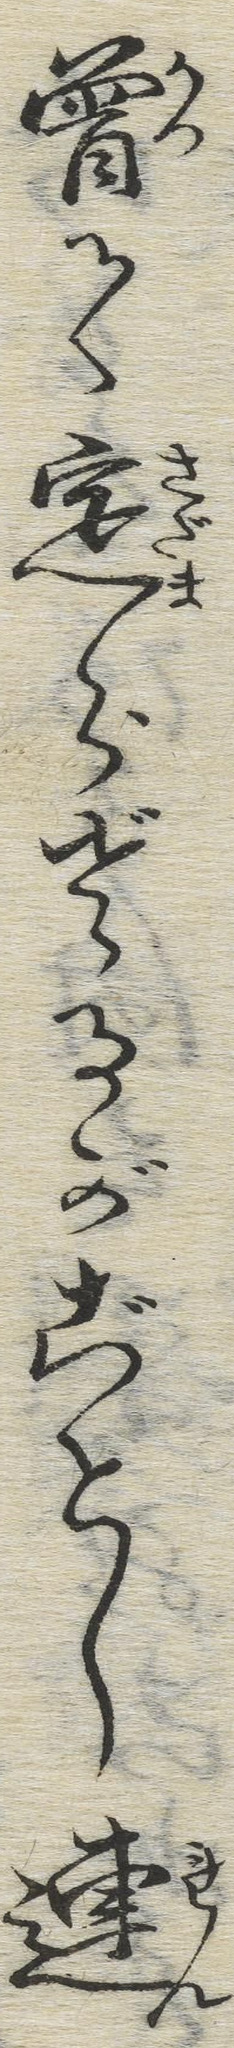曽て定らざるがごとし連
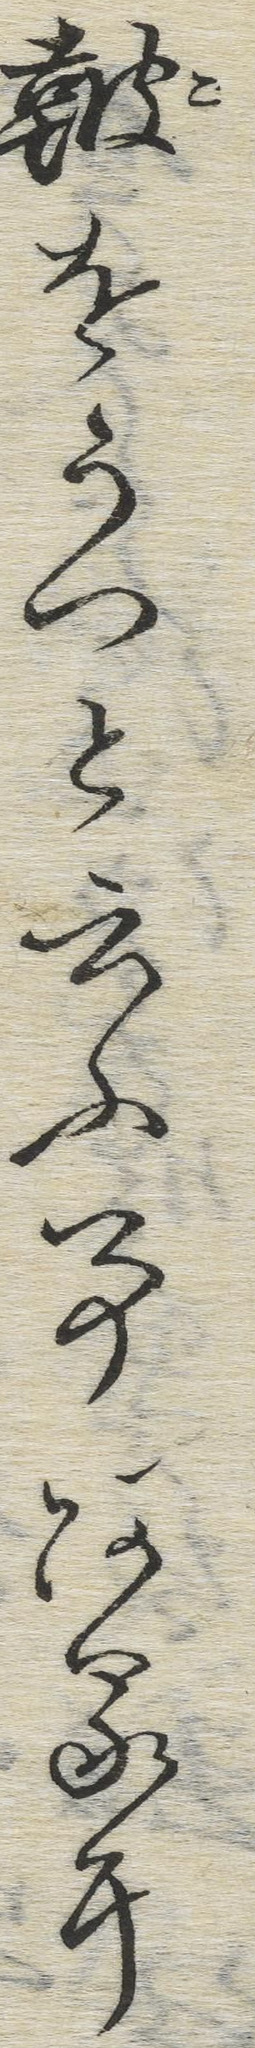皷をうつと云ふ事あるに
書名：雷公地震由來記　全
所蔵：東京大学地震研究所図書室 Earthquake Research Institute Library, The University of Tokyo, JAPAN
